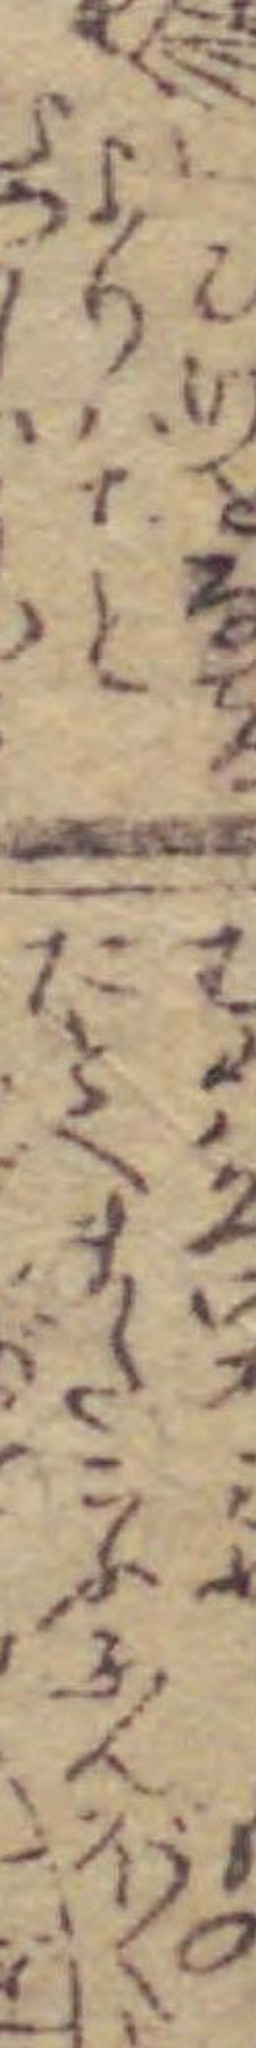たとへまたこふふんぼくとも
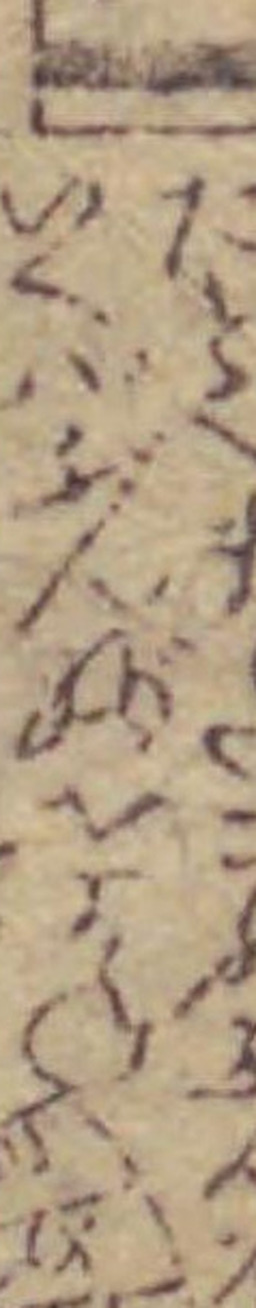いへばぶんぶをかね
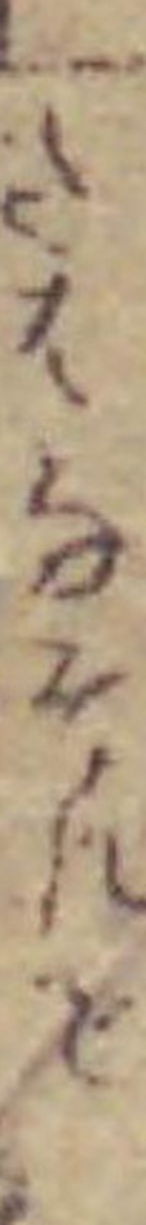たはなそれを
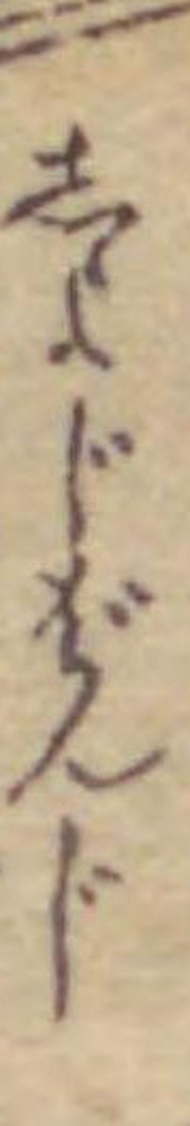しよじばんじ
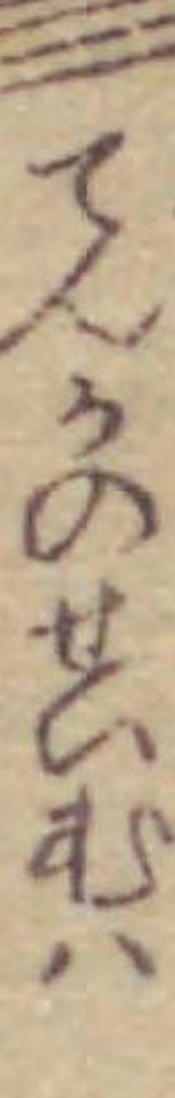てんかのせいむは
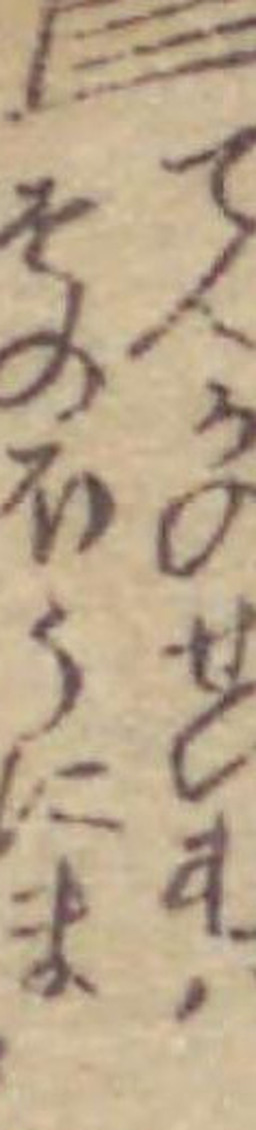そのほうにま
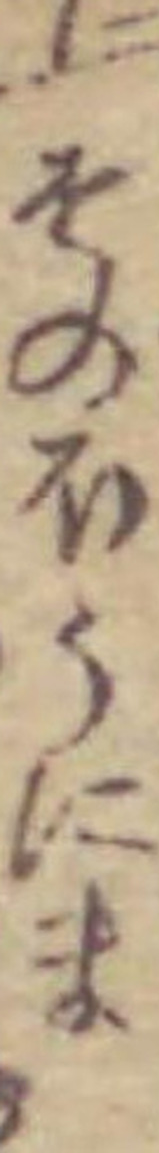そのほうにま
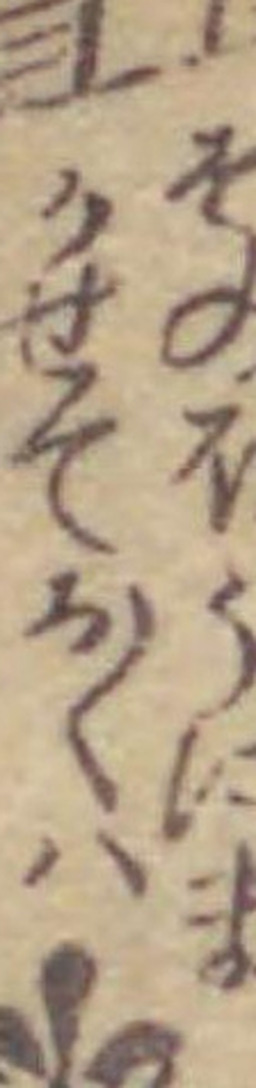かせておくは
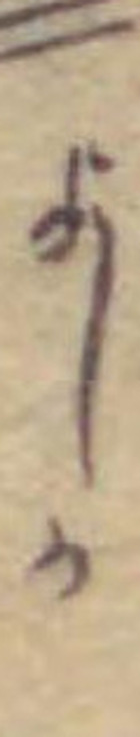よしか

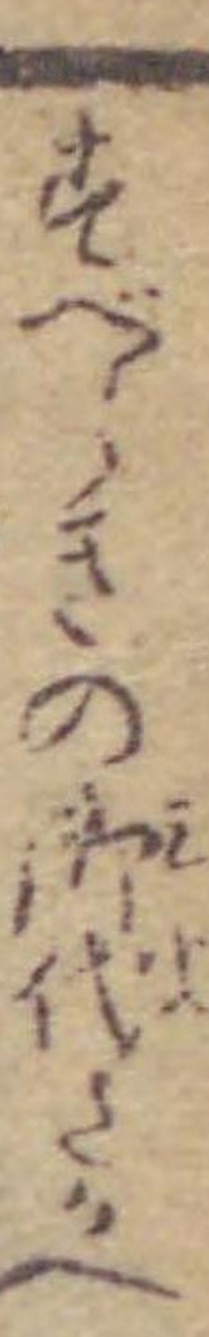すべらきの御代さか
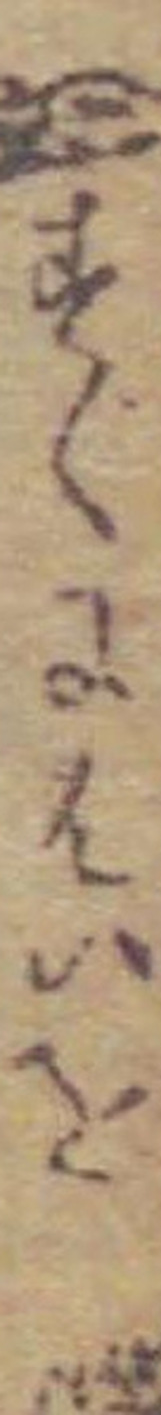すくにはいを
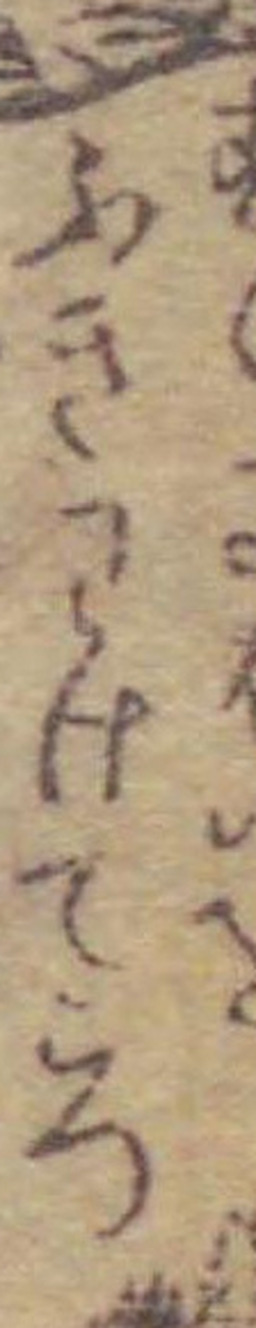ふきわけてこつ
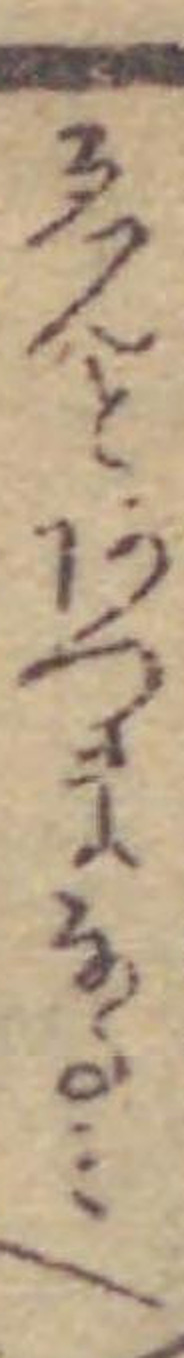ゑんとあつまなるみ
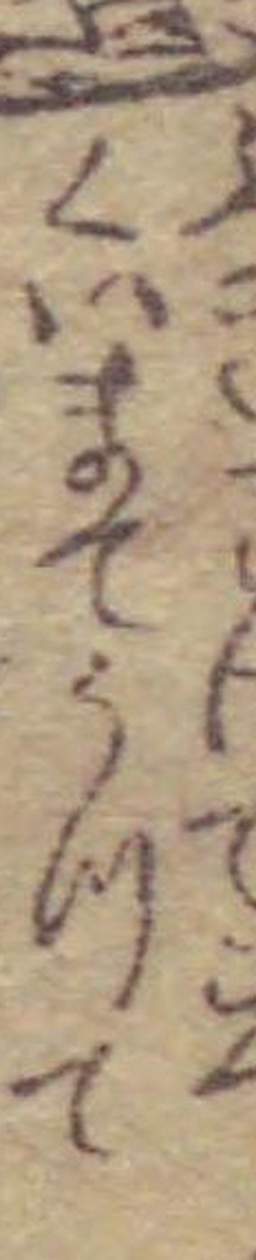くいまてうつて
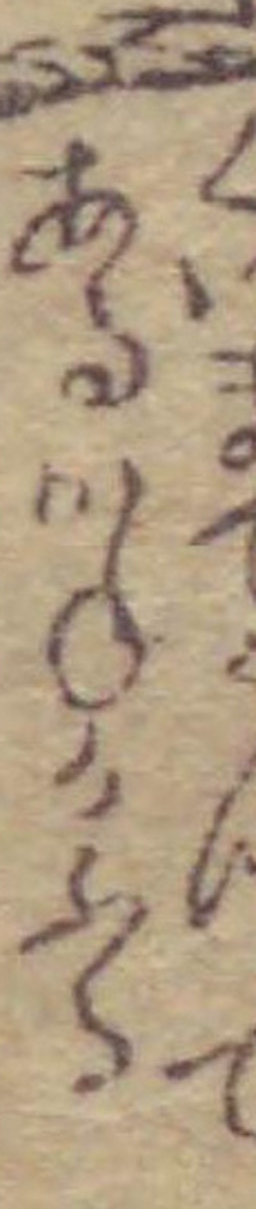あるかねかふる
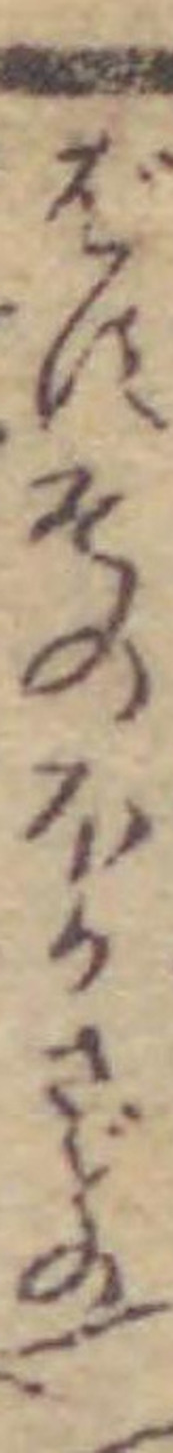ばすそのほかさどの
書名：天下一面鏡梅鉢 : 3巻
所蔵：国立国会図書館 National Diet Library, JAPAN
